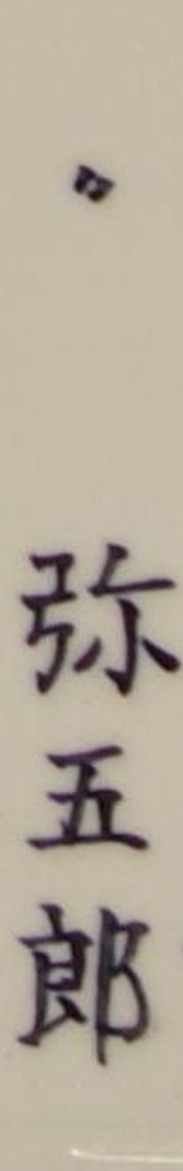弥五郎
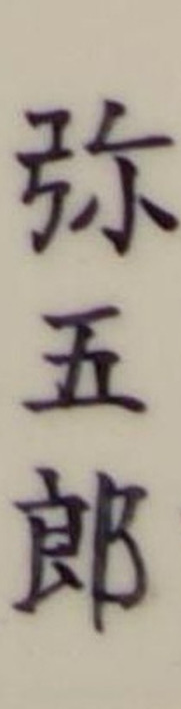弥五郎
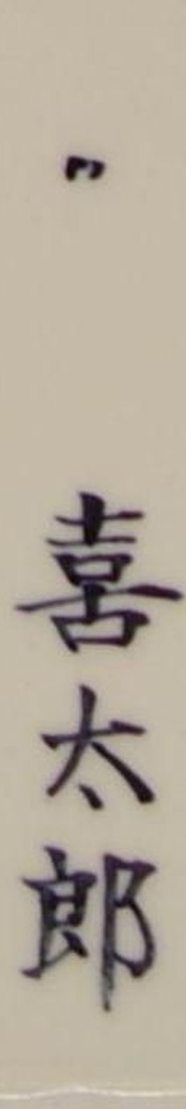喜太郎
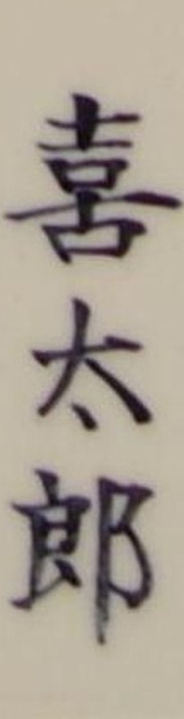喜太郎
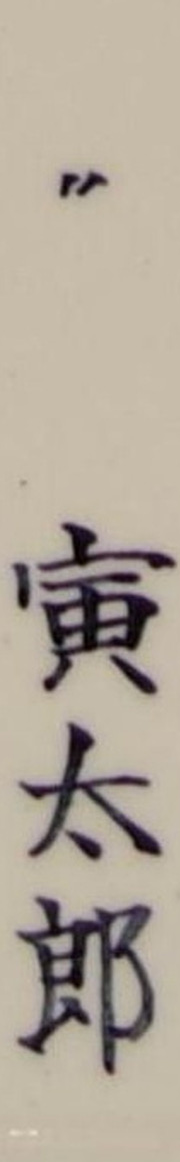寅太郎
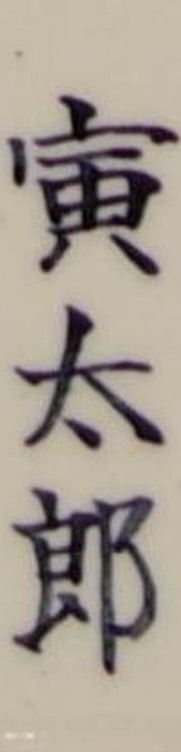寅太郎
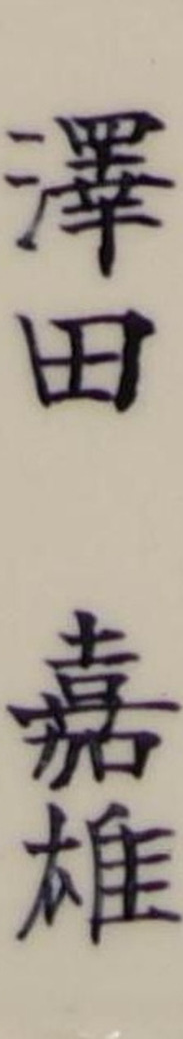澤田嘉雄
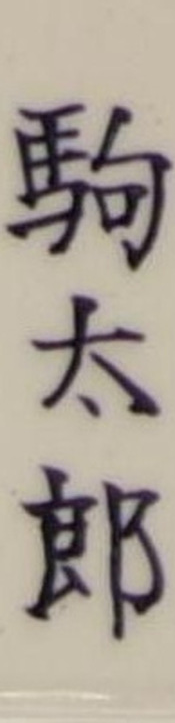駒太郎

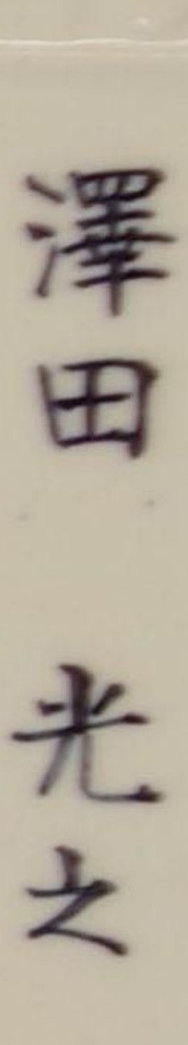澤田光之
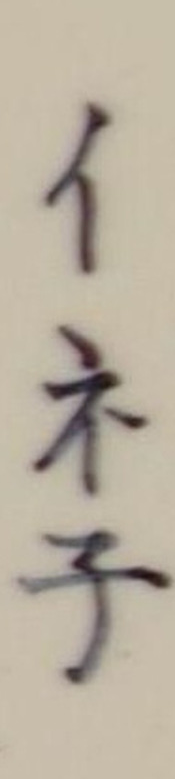イネ子
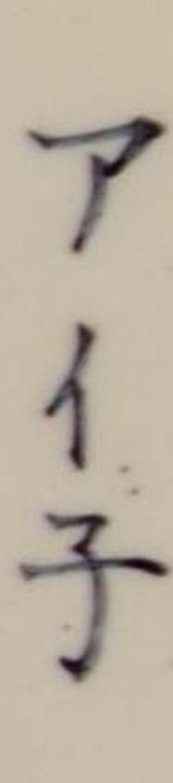アイ子
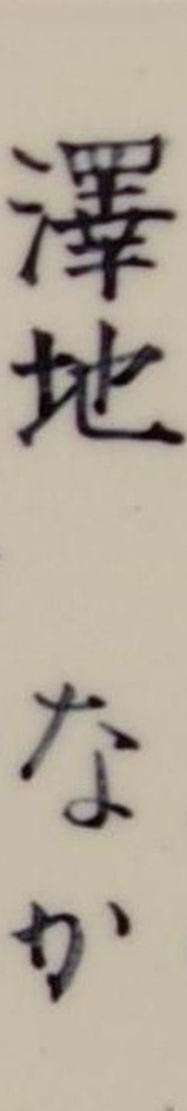澤地なか
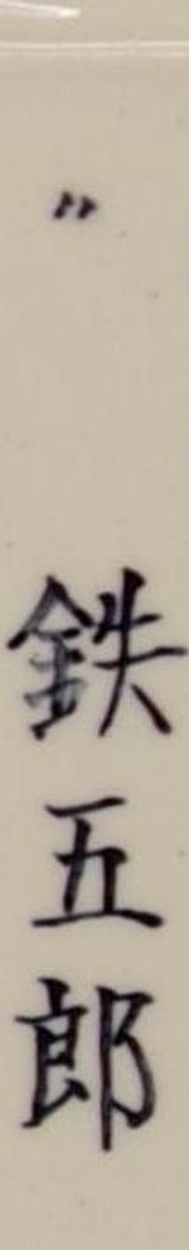鉄五郎
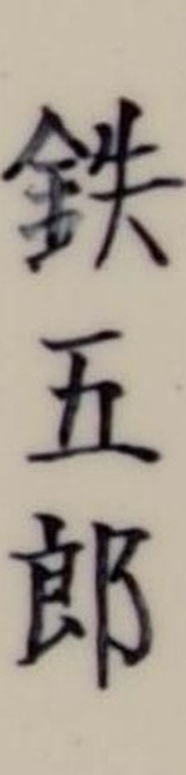鉄五郎
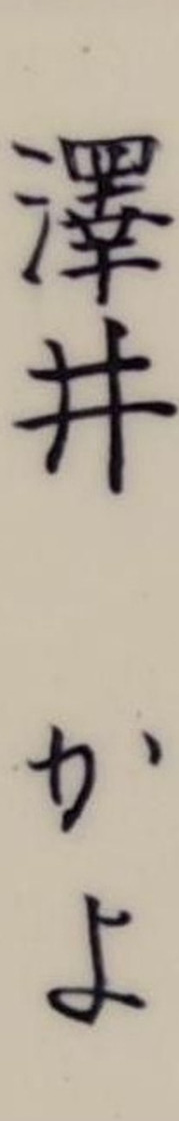澤井かよ
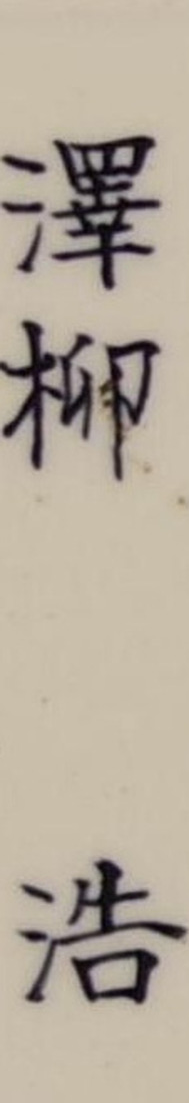澤柳浩
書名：E~L
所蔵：高野山金剛峯寺
